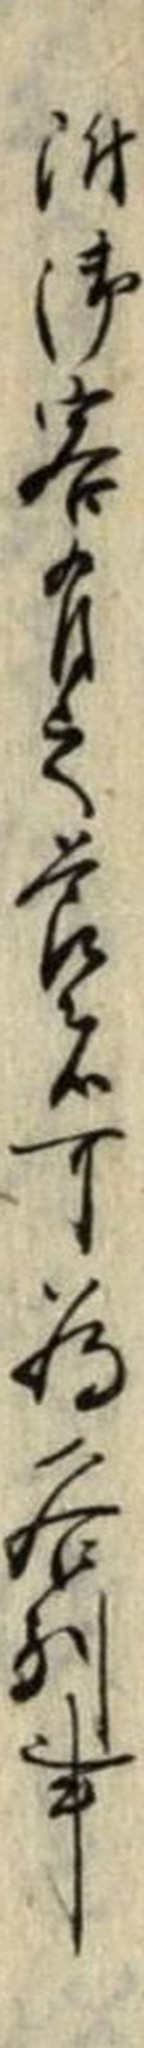附御客有之節は可為格別事
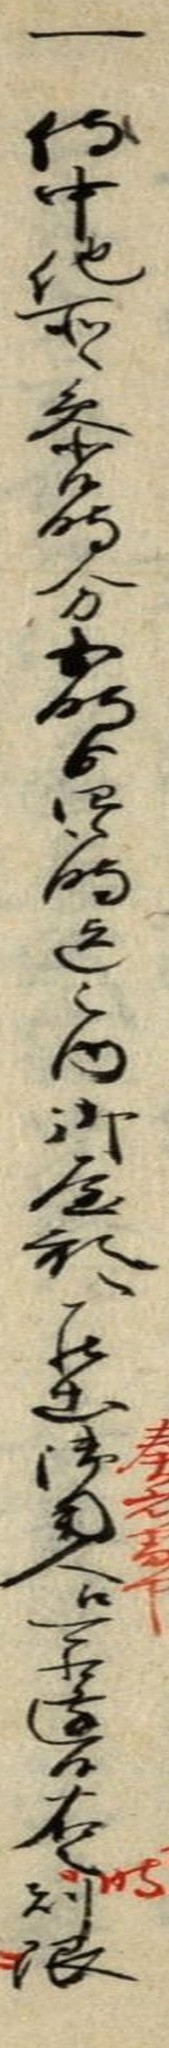一侍中他所へ参候時分五時ゟ四ツ時迄之内御屋形へ罷出御用人江可相達候右之刻限
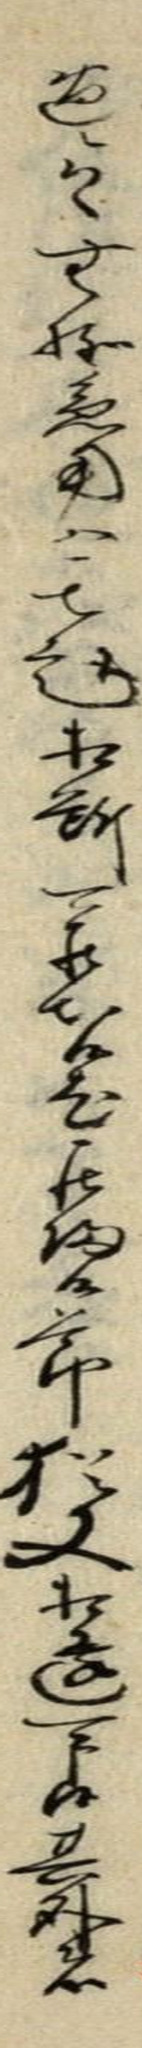過候はゝ無據急用は其趣相断可罷出候尤罷帰候節猶又相達可申候其外は
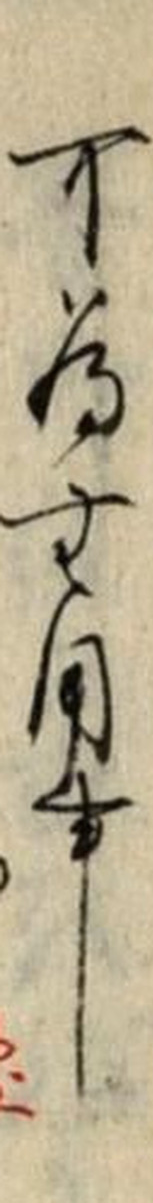可為無用事
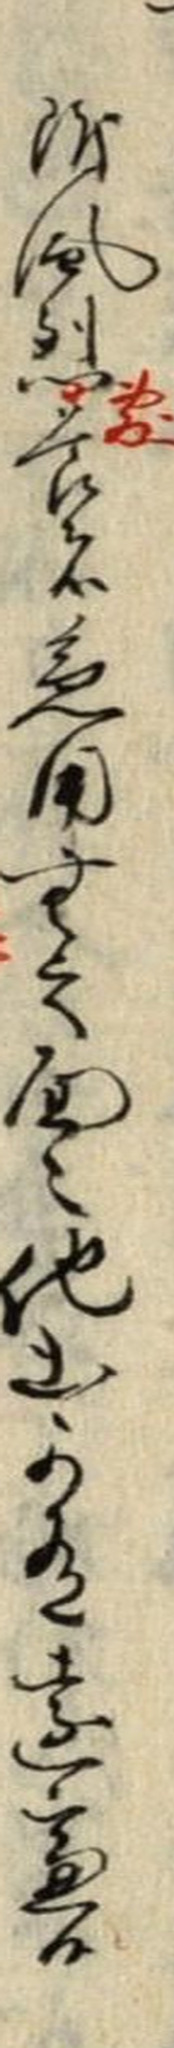附風烈節は急用無之面々他出可有遠慮候
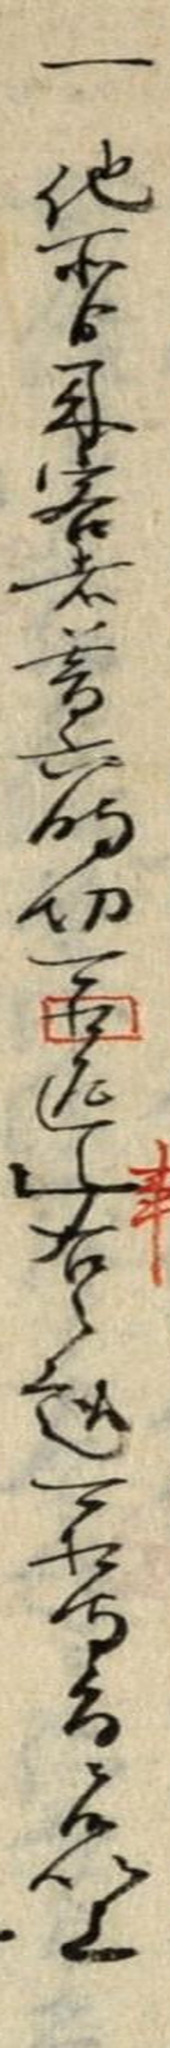一他所ゟ来客暮六時切可相返候」右之趣可相守旨に候以上
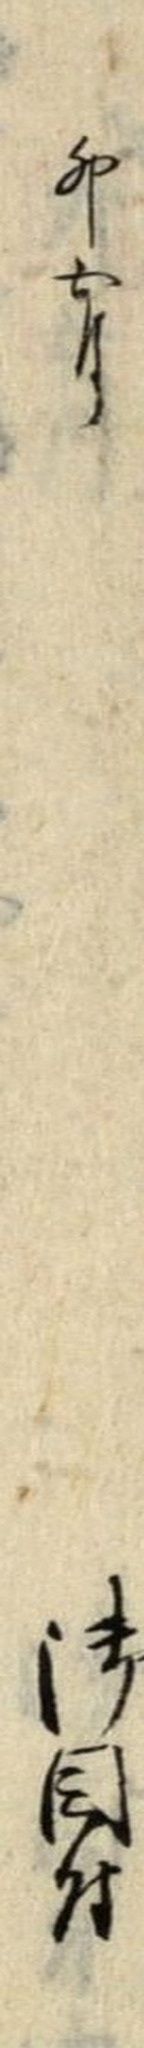卯五月御目付
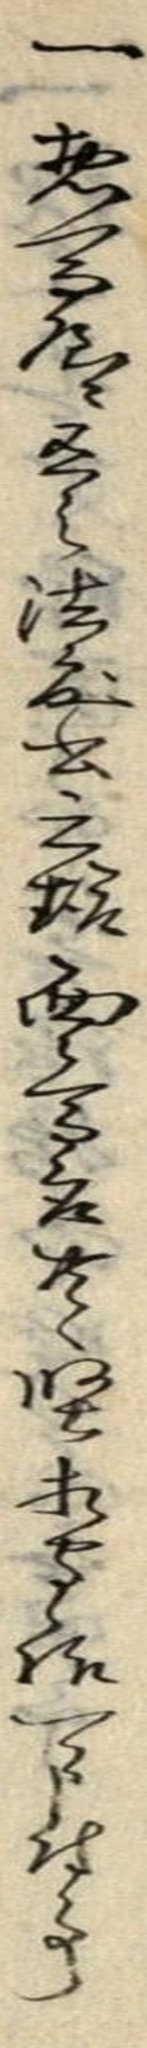一惣馬屋に有之法度書之趣面々馬取共へ堅相守候様可申付事
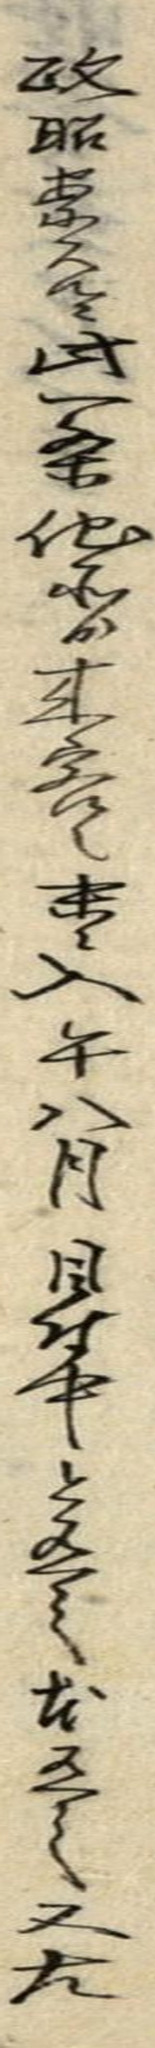政昭案するに此一条他所ゟ来客の末に入午八月目付中と有之本有之又左
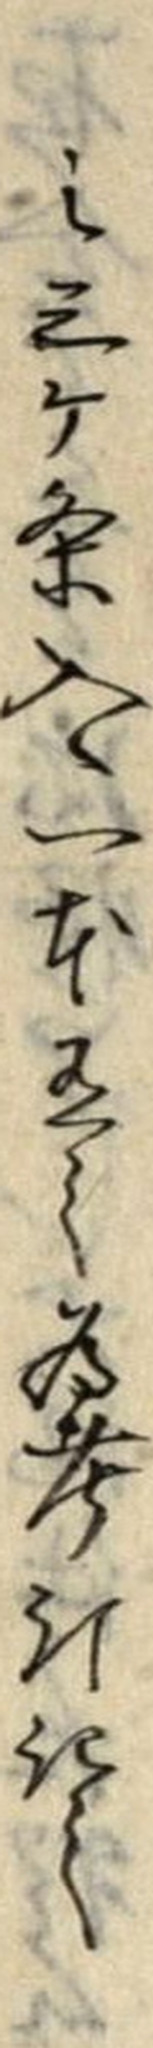之三ケ条入候一本有之為考計記之
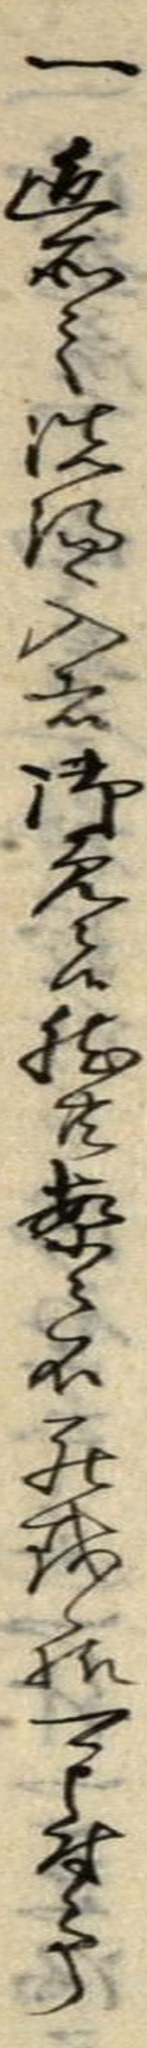一近所の洗湯へ入者御免に候然共繁に不罷越候様可申付事

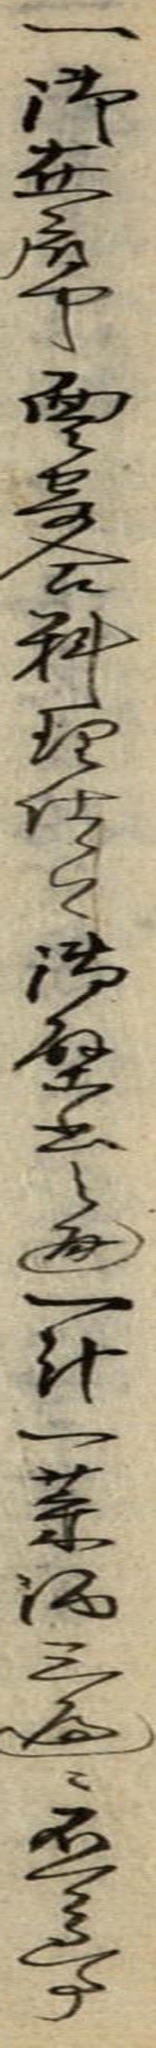一御在府中面々寄合料理仕候はゝ御壁書之通一汁一菜酒三遍に不可過事
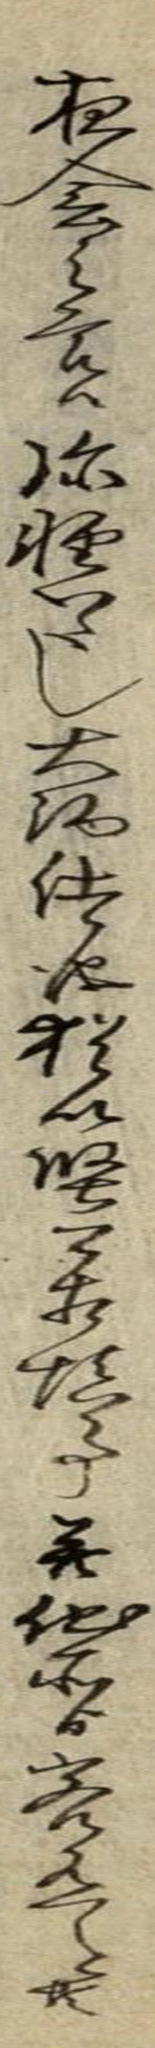夜会之節は弥軽いたし大酒仕候儀猶以堅可相慎事幷他所ゟ客有之候共
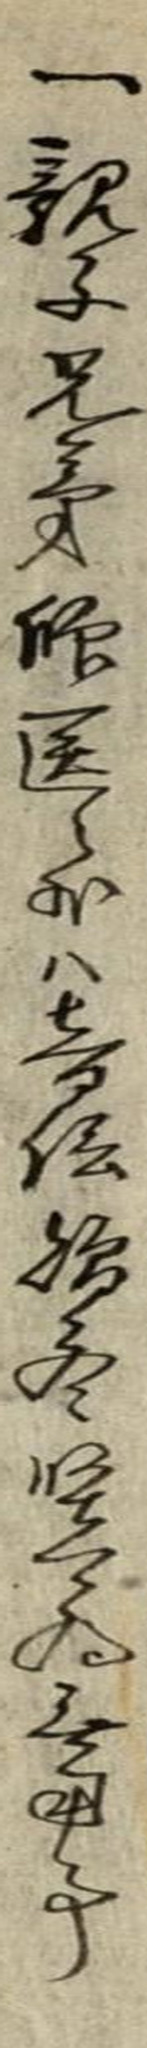一親子兄弟師匠之外は音信贈答堅可為無用事
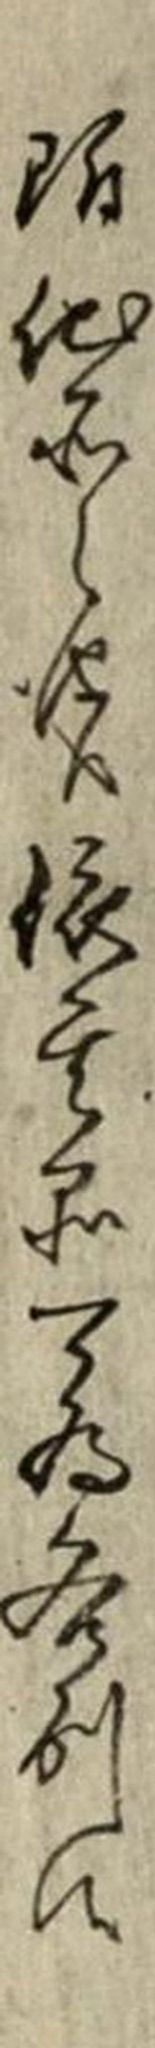附他所之儀は依其品可為各別候
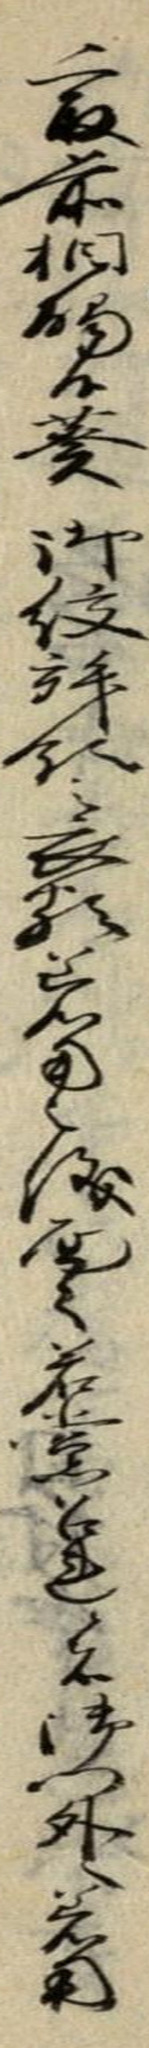最前相触候葵御紋拝領之衣類着用之儀面々若党召連候者御門外へ着用
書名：三都并道中之部
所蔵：福井県文書館 Fukui Prefectural Archives
